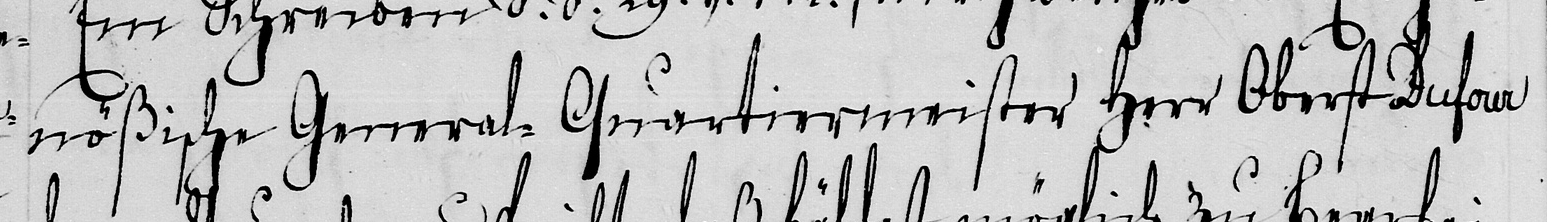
nößische General-Quartiermeister Herr Oberst Dufour
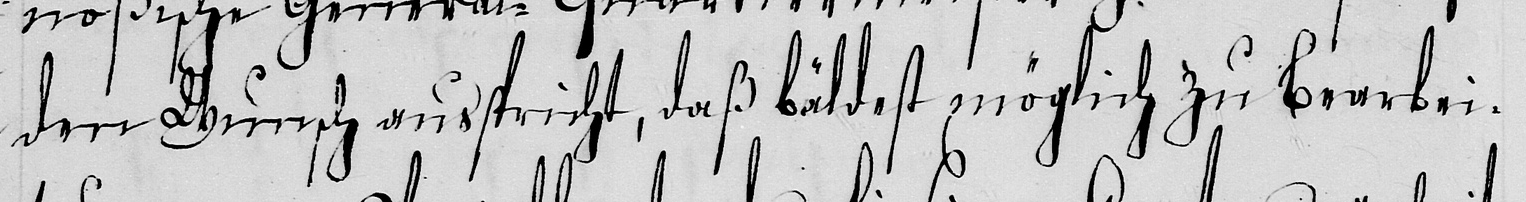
den Wunsch ausspricht, daß bäldest möglich zu Bearbei¬
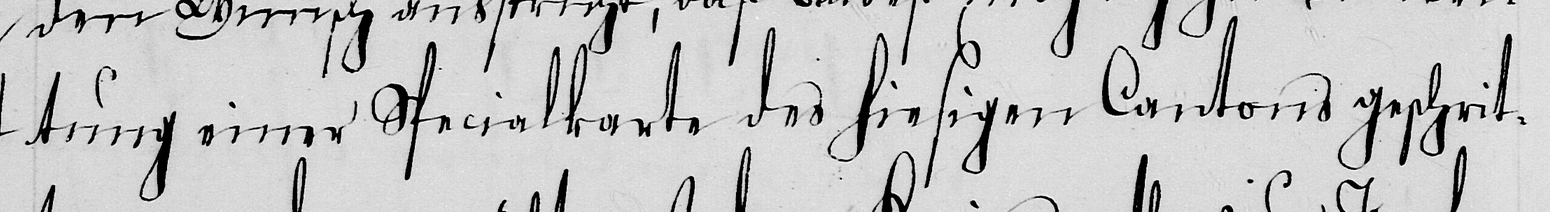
tung einer Specialkarte des hiesigen Cantons geschrit¬
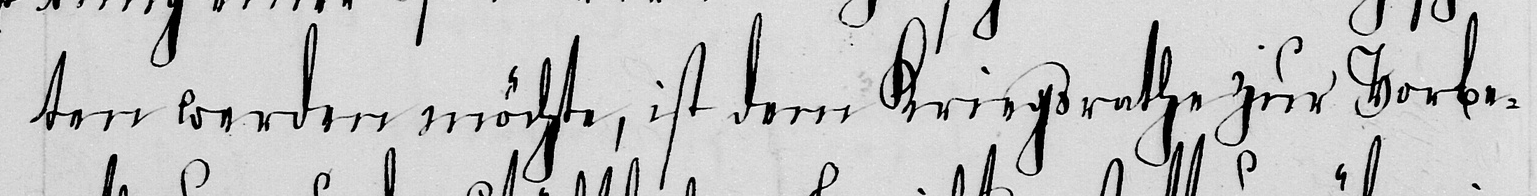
ten werden möchte, ist dem Kriegsrathe zur Vorbe¬
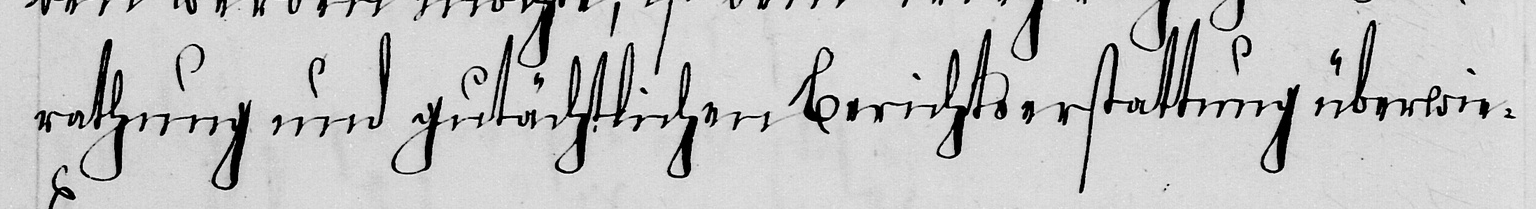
rathung und gutächtlichen Berichtserstattung überwie¬
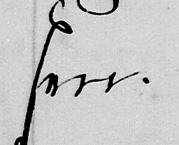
seine
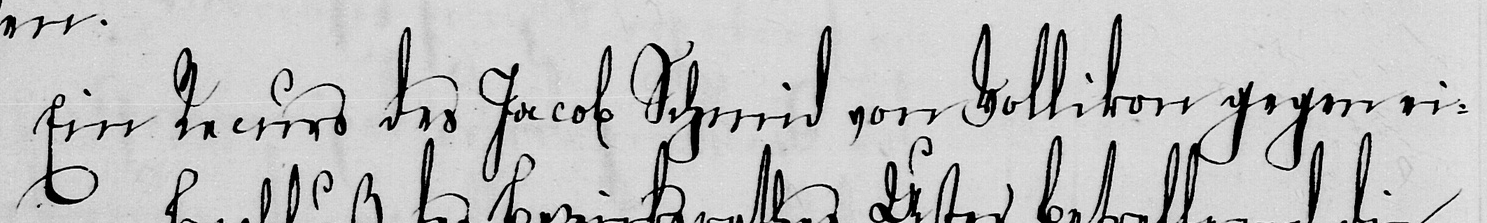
Ein Recurs des Jacob Schmid von Vollikon gegen ei¬
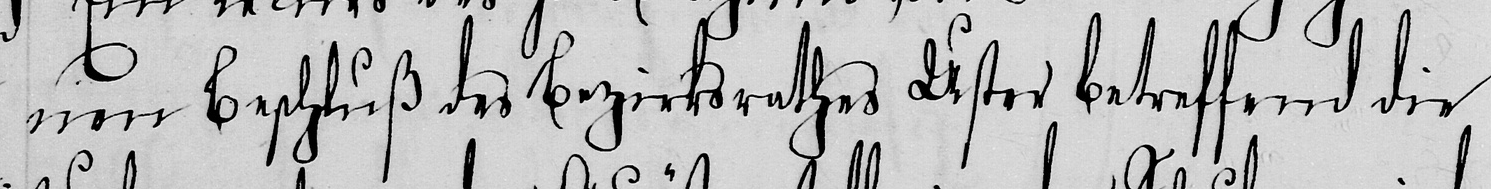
nen Beschluß des Bezirksrathes Uster betreffend die
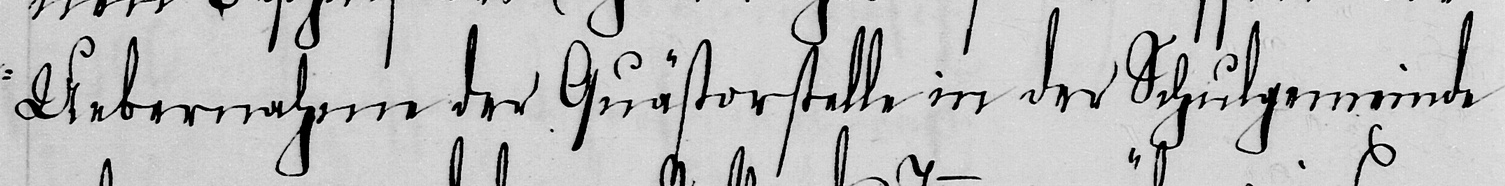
Uebernahme der Quästorstelle in der Schulgemeinde
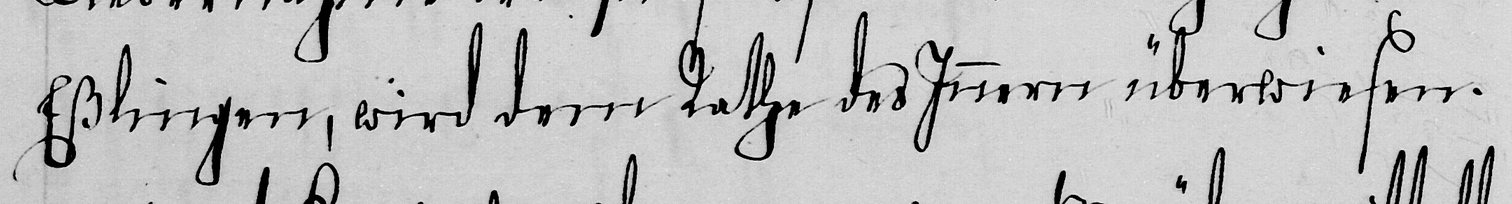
Eßlingen, wird dem Rathe des Innern überwiesen.
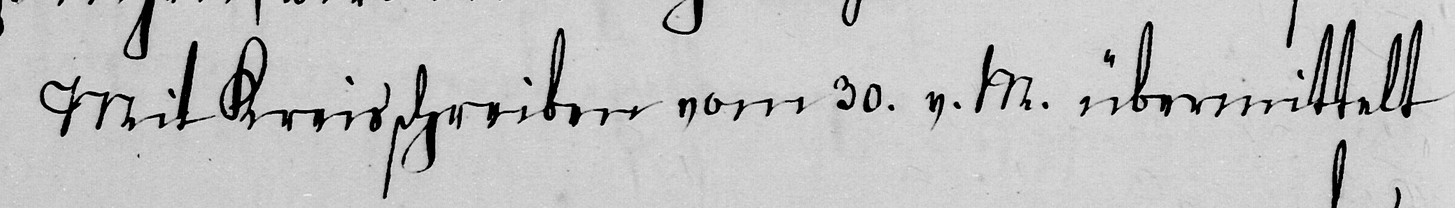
Mit Kreisschreiben vom 30. v. M. übermittelt
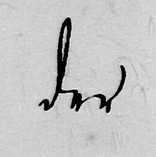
der
